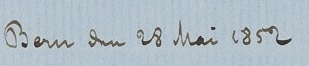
Bern den 28 Mai 1852
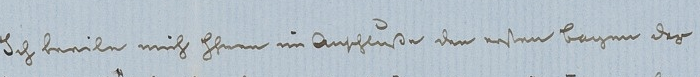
Ich beeile mich Ihnen im Anschluße den ersten Bogen des
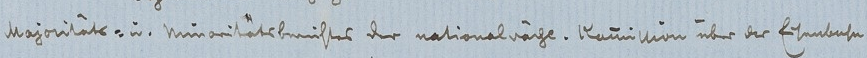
Majoritäts- u. Minoritätsberichtes der nationalräthl. Kommission über das Eisenbahn
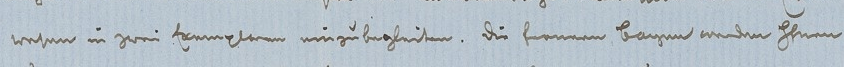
Wesen in zwei Exemplaren einzubegleiten. Die fernern Bogen werden Ihnen
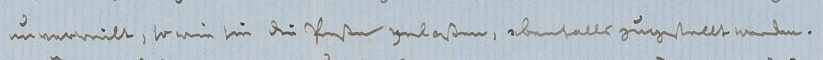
unverweilt, so wie sie die Preße verlaßen, ebenfalls zugestellt werden.
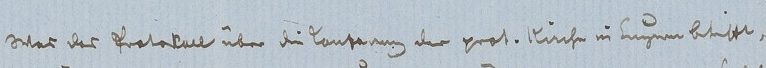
Was das Protokoll über die Conferenz der prot. Kirche in Luzern betrifft,
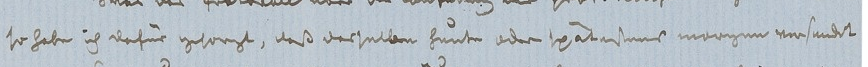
so habe ich dafür gesorgt, daß dasselbe heute oder spätestens morgen versendet
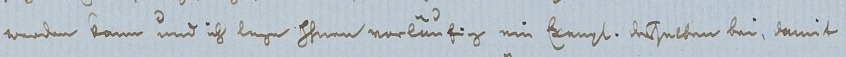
werden kann und ich lege Ihnen vorläufig ein Exempl. desselben bei, damit
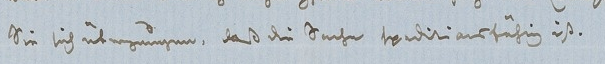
Sie sich überzeugen, daß die Sache speditionsfähig ist.
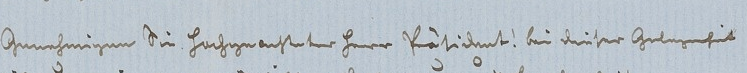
Genehmigen Sie hochgeachteter Herr Präsident! bei dieser Gelegenheit
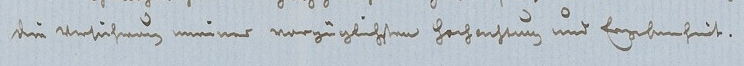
die Versicherung meiner vorzüglichsten Hochachtung und Ergebenheit.
